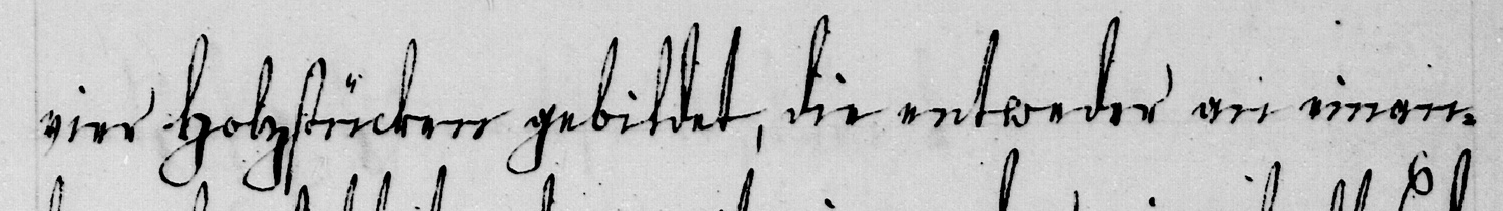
vier Holzstücken gebildet, die entweder an einan¬
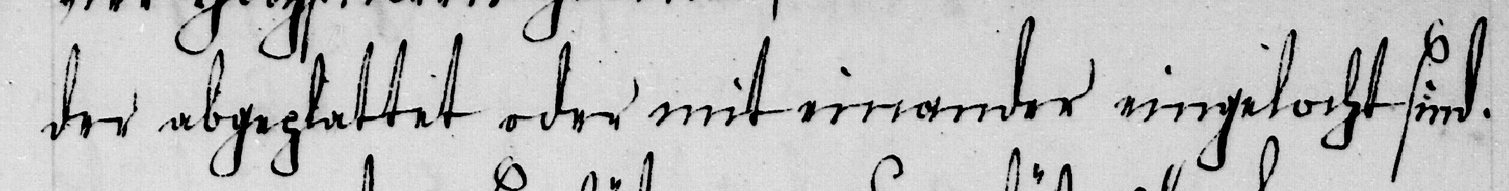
der abgeplattet oder mit einander eingelocht sind.
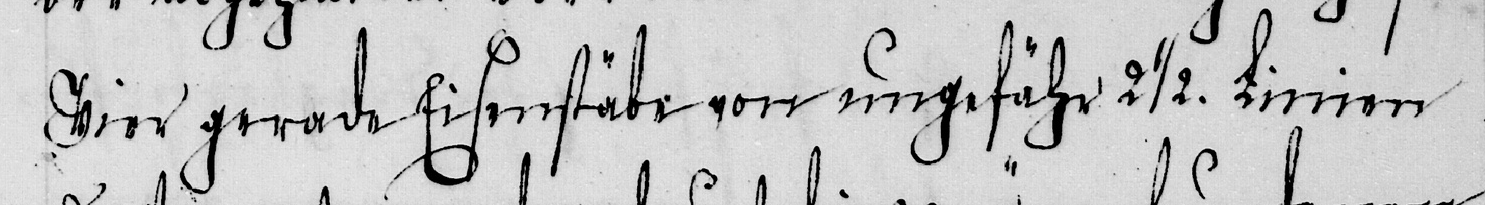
Vier gerade Eisenstäbe von ungefähr 2 1/2. Linien
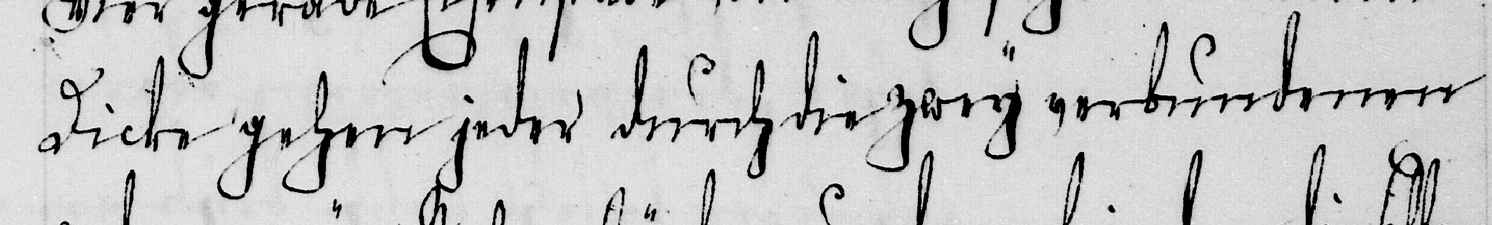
Dicke gehen jeder durch die zwey verbundenen
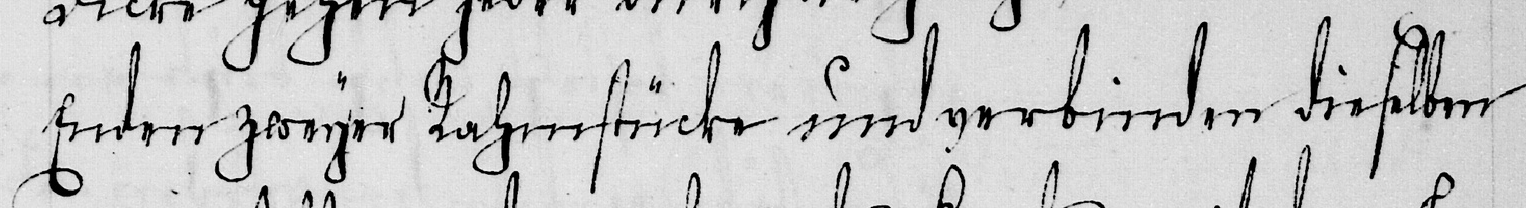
Enden zweyer Rahmstücke und verbinden dieselben
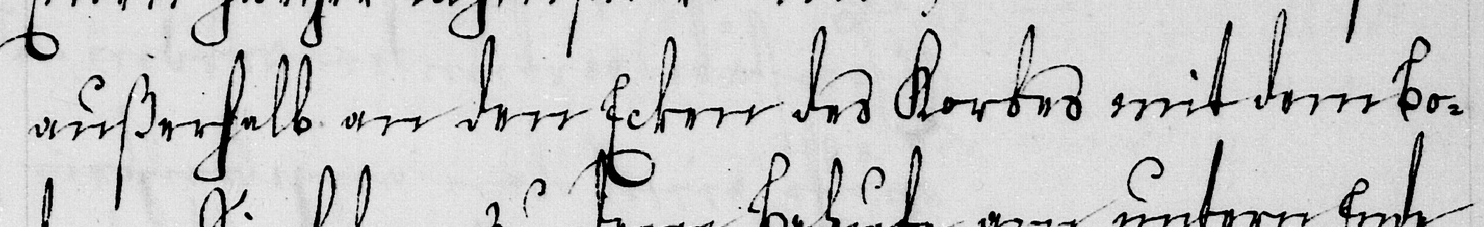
außerhalb an den Ecken des Korbes mit dem Bo¬
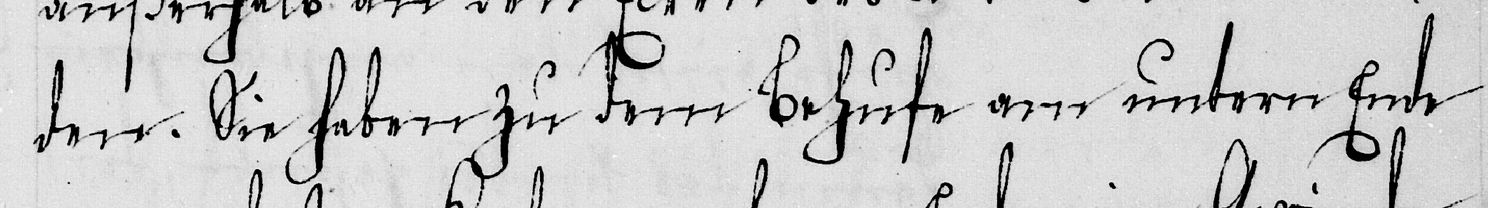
den. Sie haben zu dem Behufe am untern Ende
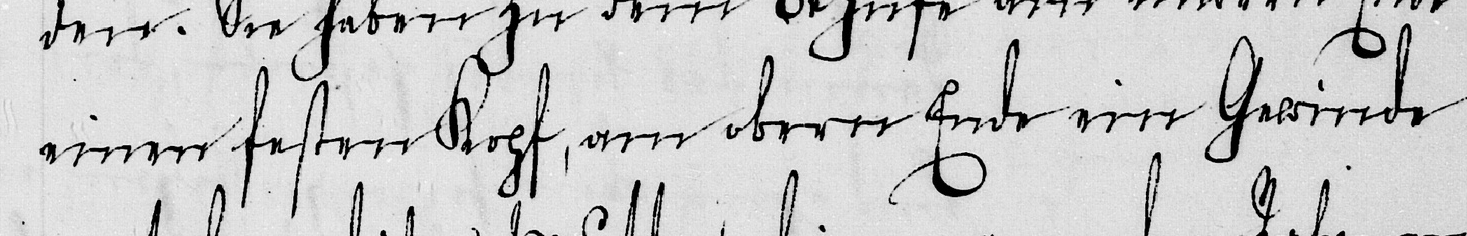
einen festen Kopf, am obern Ende ein Gewinde
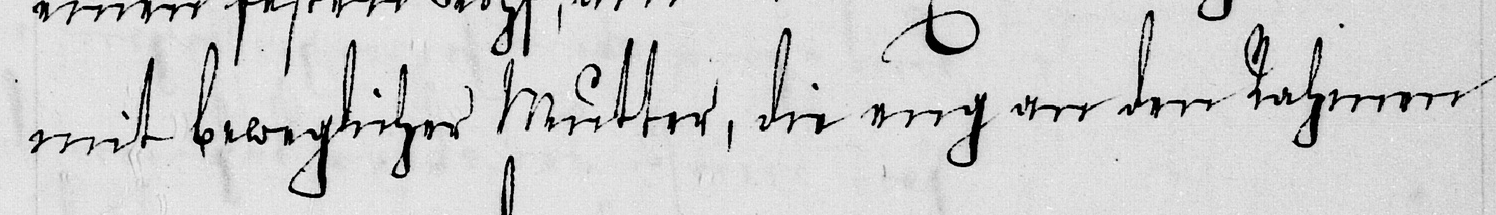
mit beweglicher Mutter, die eng an den Rahmen
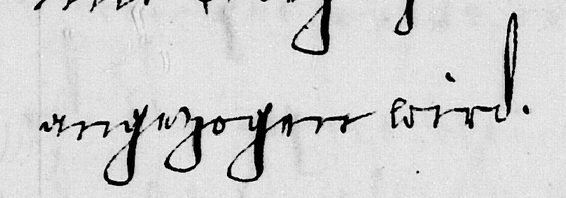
angezogen wird.
